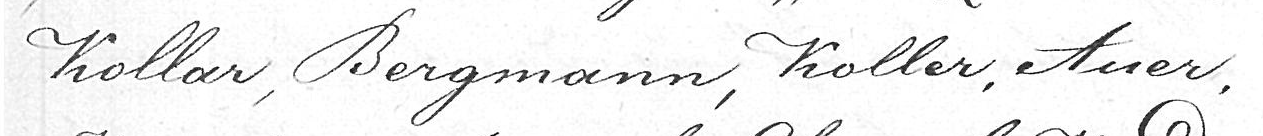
Kollar, Bergmann, Koller Auer,
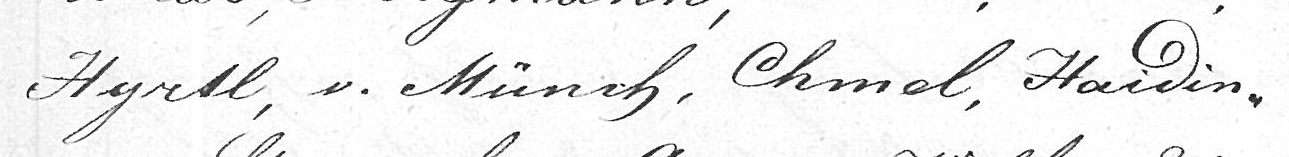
Hyrtl, v. Münch, Chmel, Haidin-
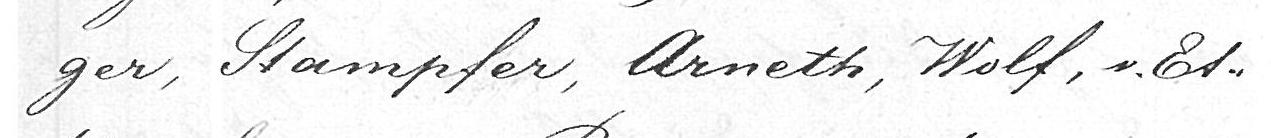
ger, Stampfer, Arneth, Wolf, v. Et-
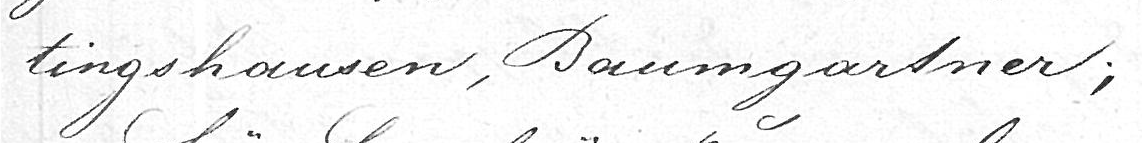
tingshausen, Baumgartner;
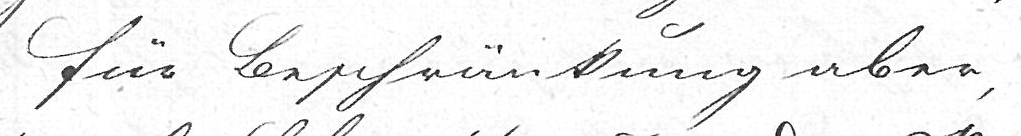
für Beschränkung aber
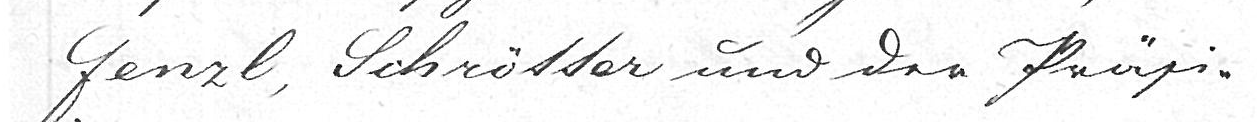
Fenzl, Schrötter und der Präsi-
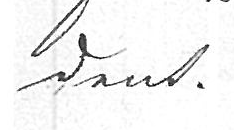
dent.
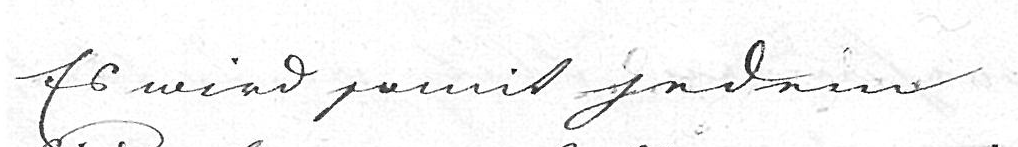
Es wird somit jedem
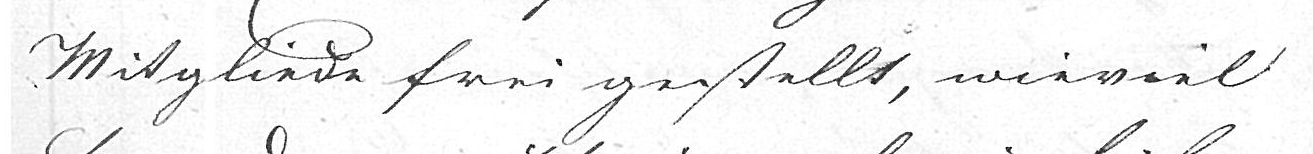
Mitgliede frei gestellt, wieviel
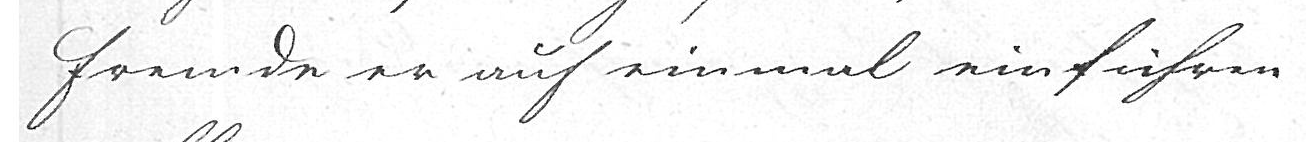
Fremde er auf einmal einführen
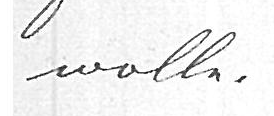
wolle.
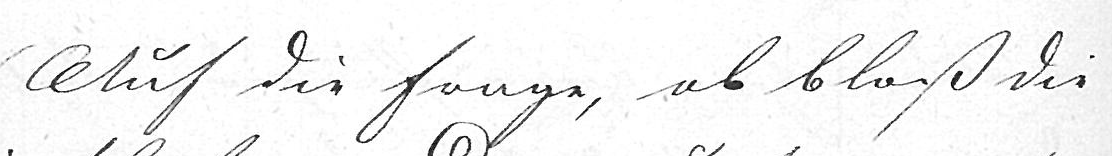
Auf die Frage, ob bloß die
